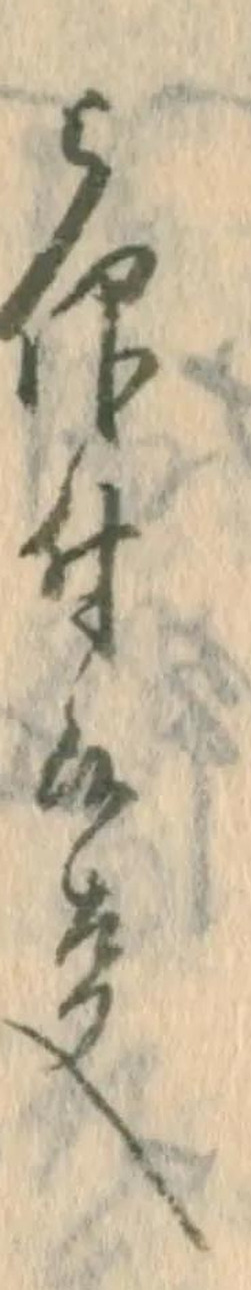被仰付候事
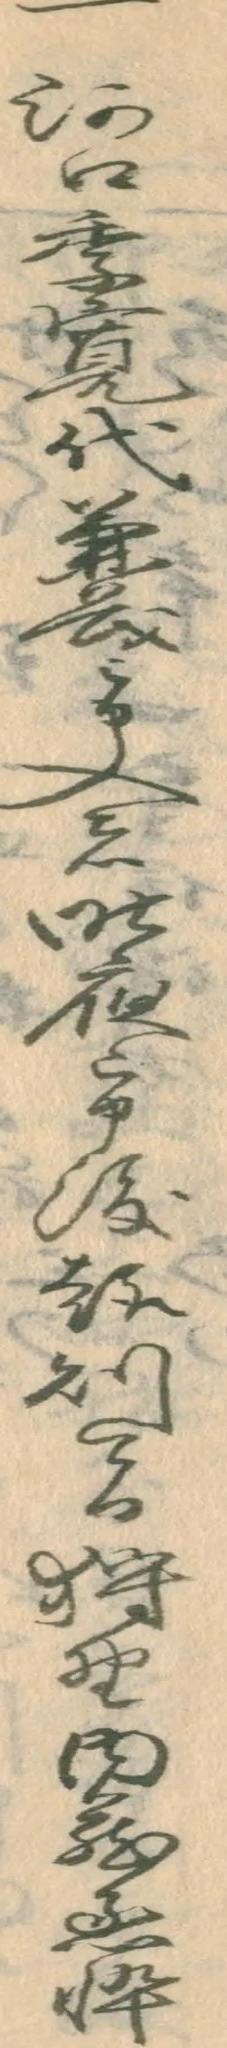一河口季寛代兼茂被申入は昨夜被申渡趣則今日狩野内蔵丞忰
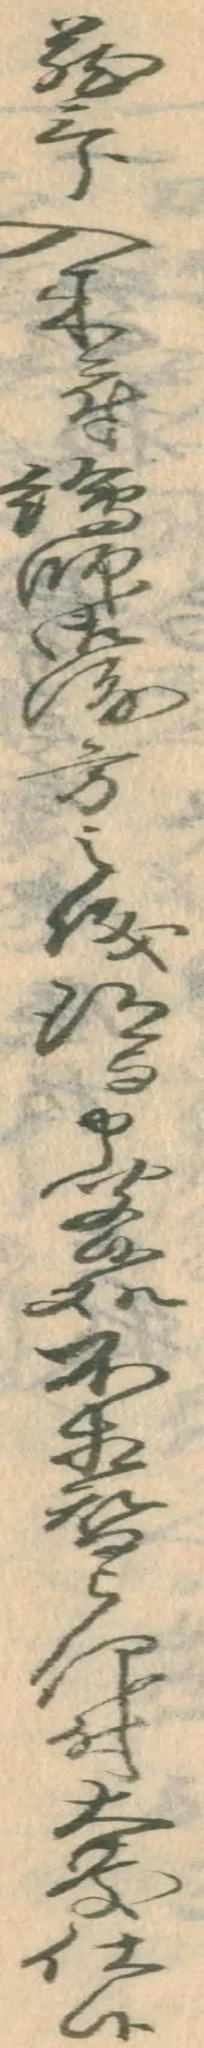蔵三郎入来ニ付絵師御渡方之儀跡而申聞候処不相替被仰付大慶仕候
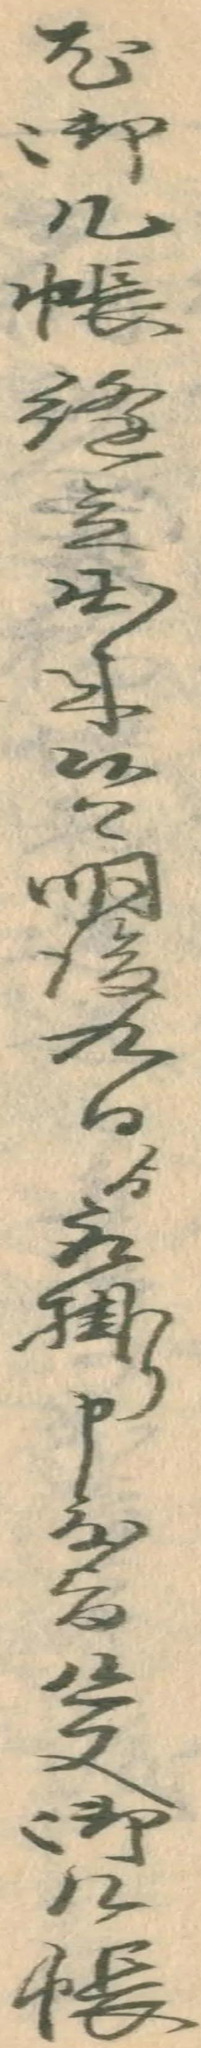尤御几帳縫立出来候ハヽ明後九日ゟ取掛り申度旨且又御几帳
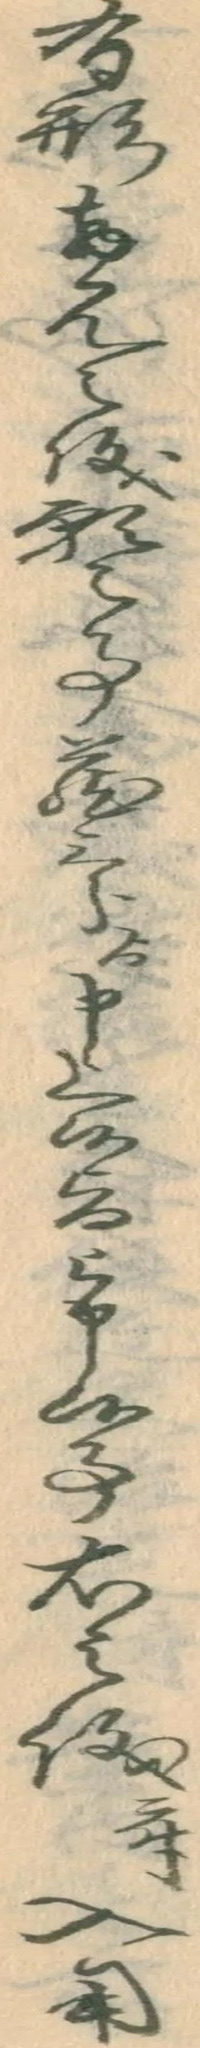有形拝見之儀願之事蔵三郎ゟ申上候旨被申候事右之儀ニ付入用

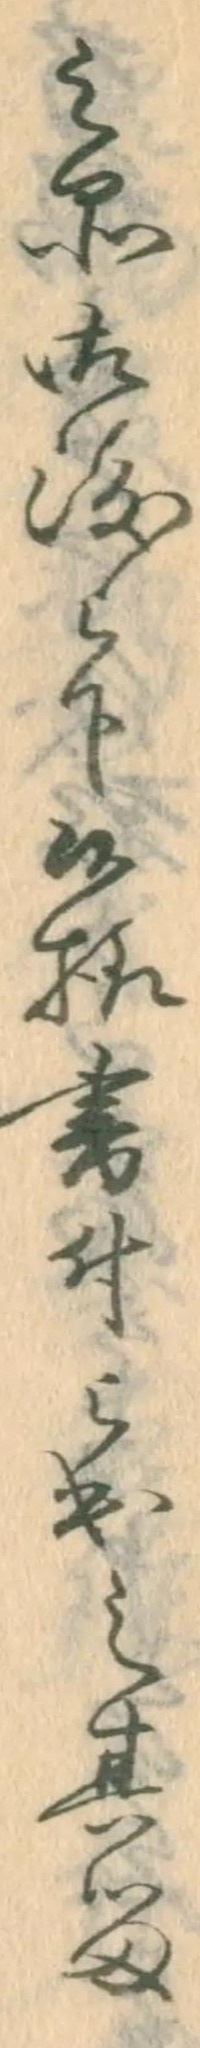之品御渡被下候様書付被出之其留
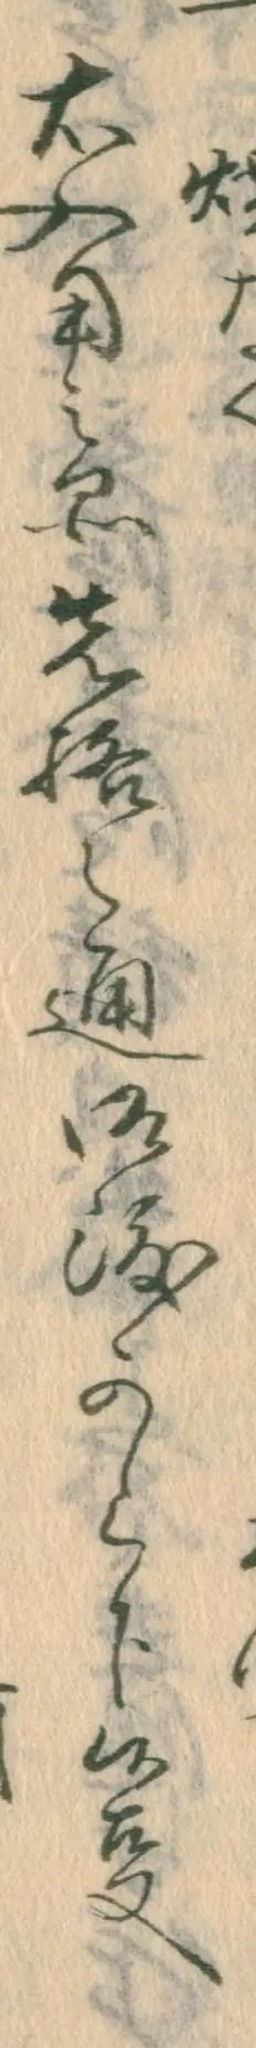右入用之品先格之通御渡可被下候事
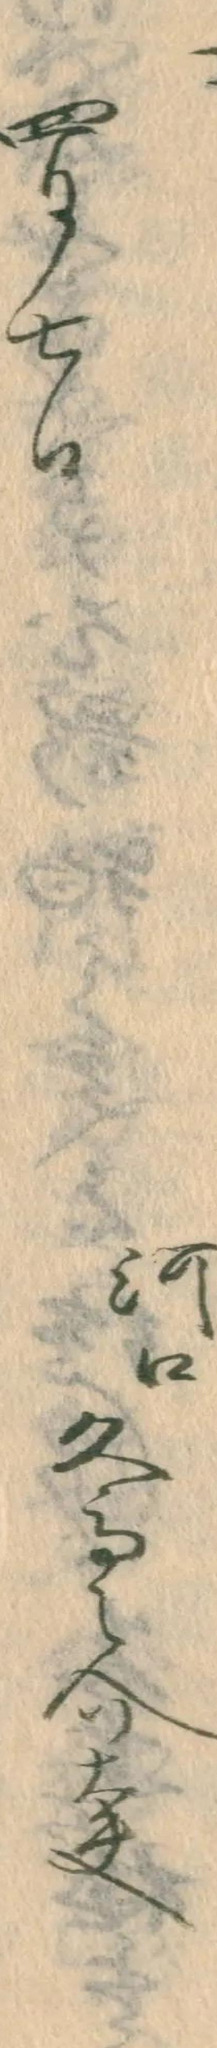四月七日河口久馬之介大夫
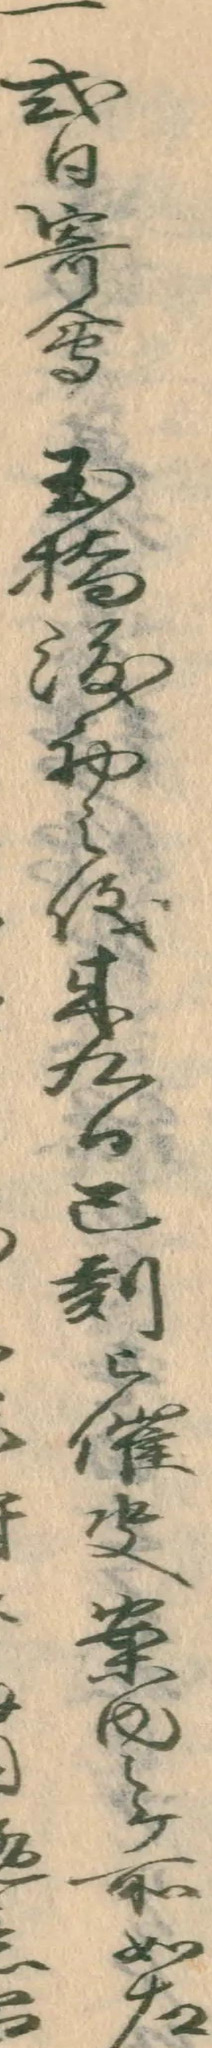一式日寄会玉橋渡物之儀来九日巳刻被催決案内之ケ所如左
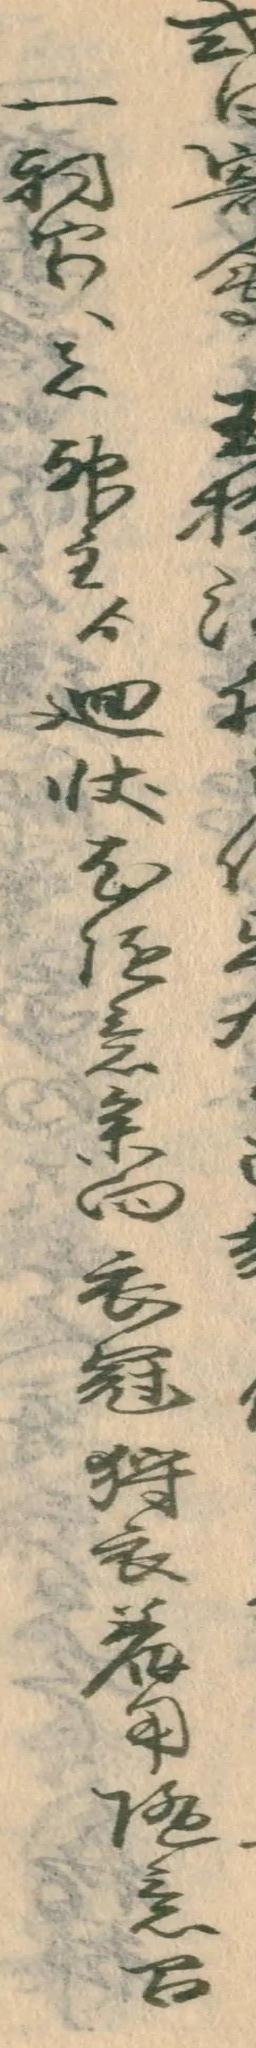一祠官へは神主ゟ廻状尤随意参向衣冠狩衣着用随意召
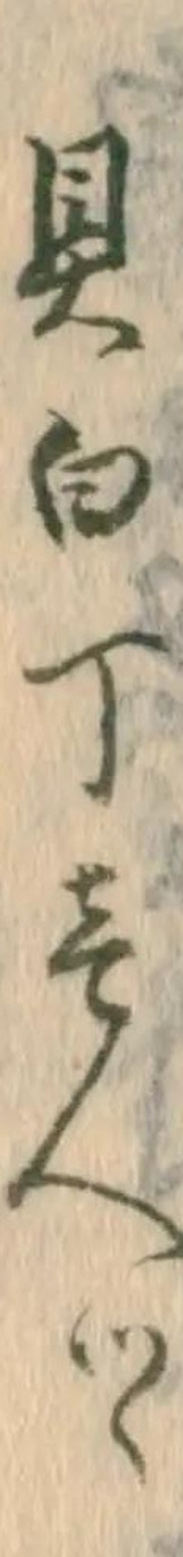具白丁壱人ツヽ
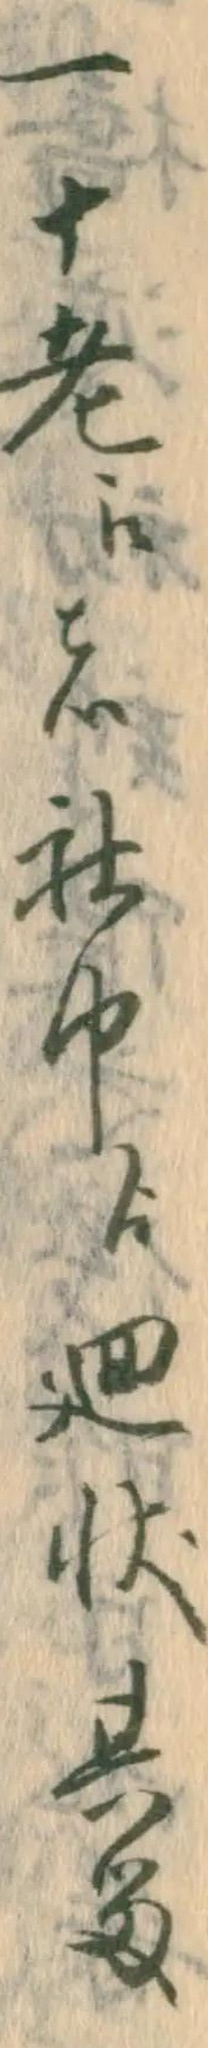一十老江は社中ゟ廻状其留
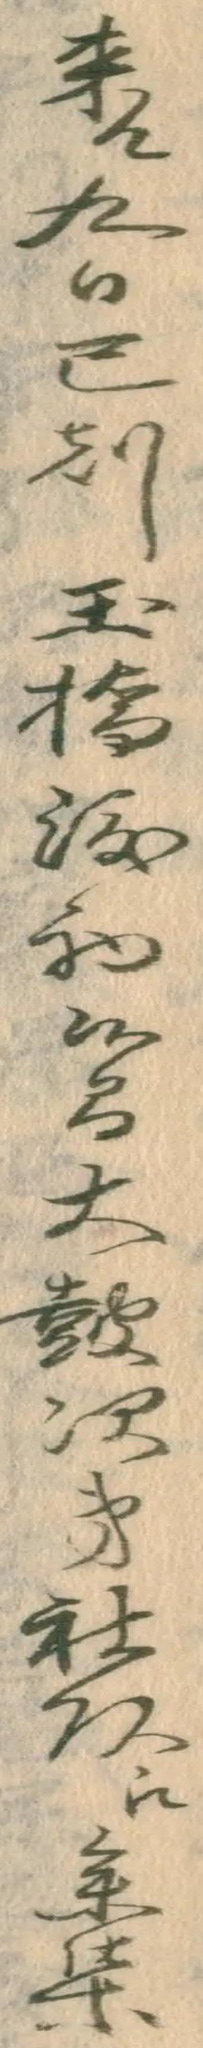来ル九日巳刻玉橋渡初候間大鼓次第社頭江参集
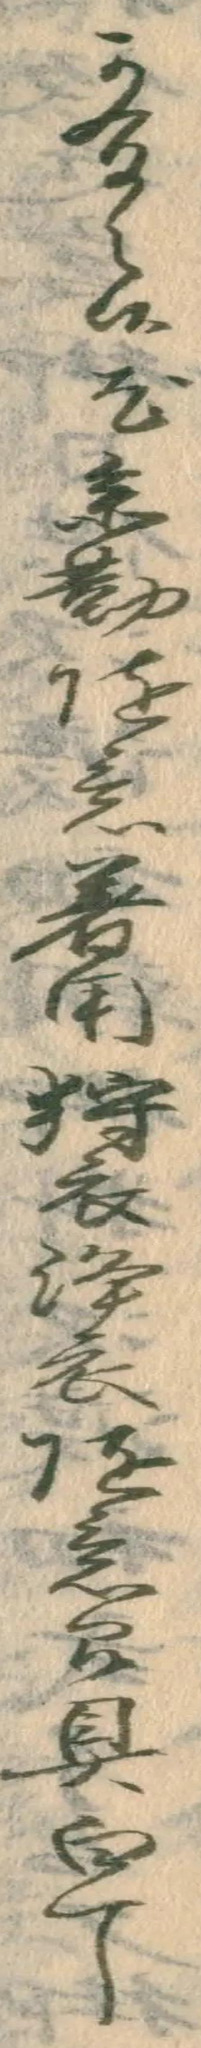可有之候尤参勤随意着用狩衣浄衣随意召具白丁
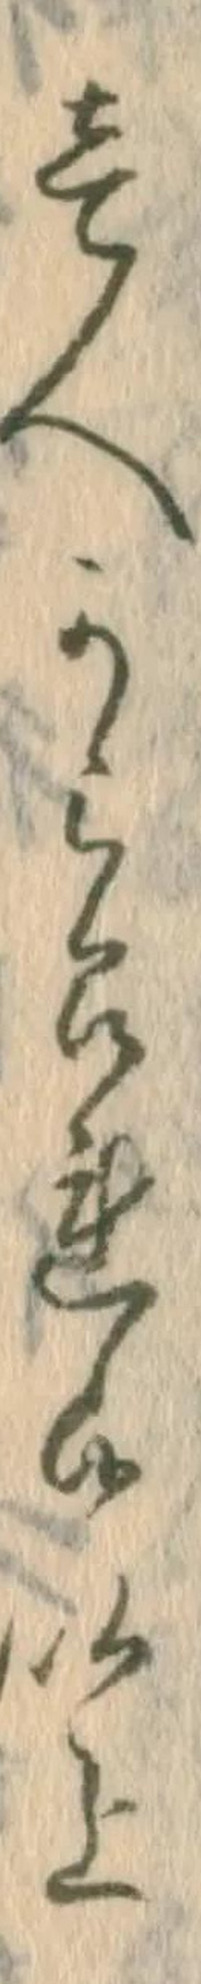壱人可被召連候以上
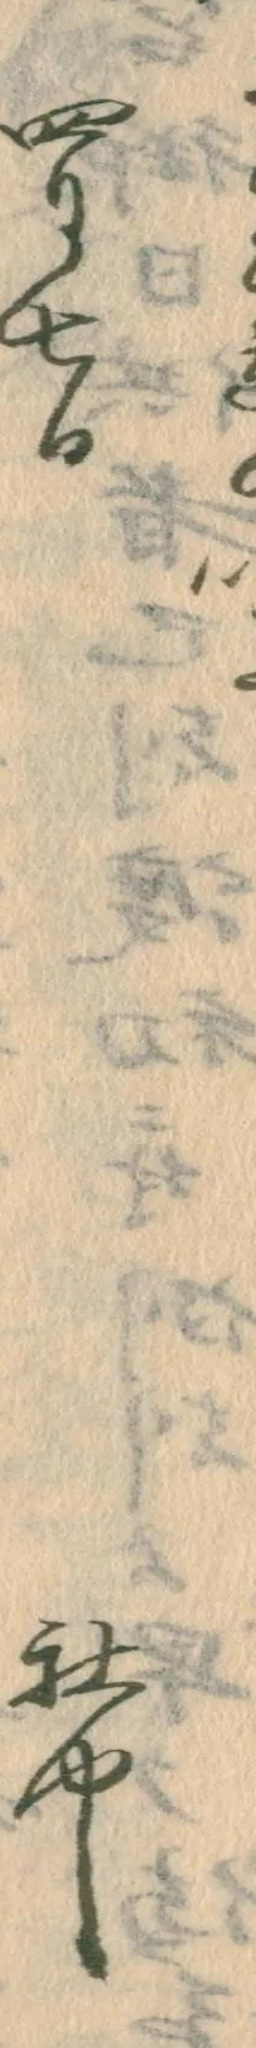四月七日社中
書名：賀茂社記録. 第17冊
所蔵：国立国会図書館 National Diet Library, JAPAN
